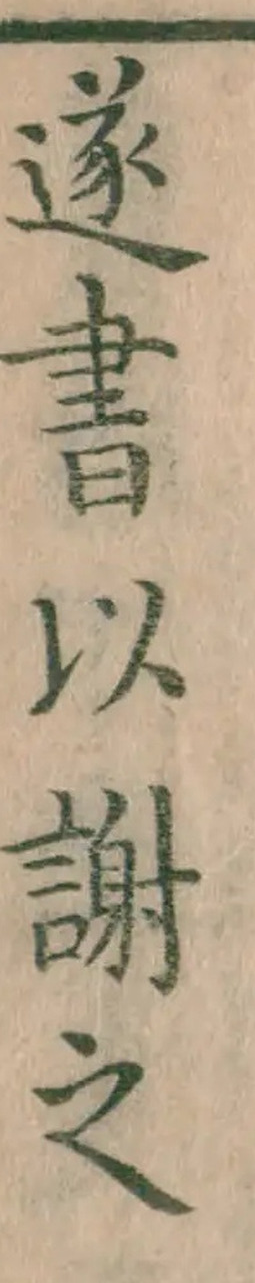遂書以謝之

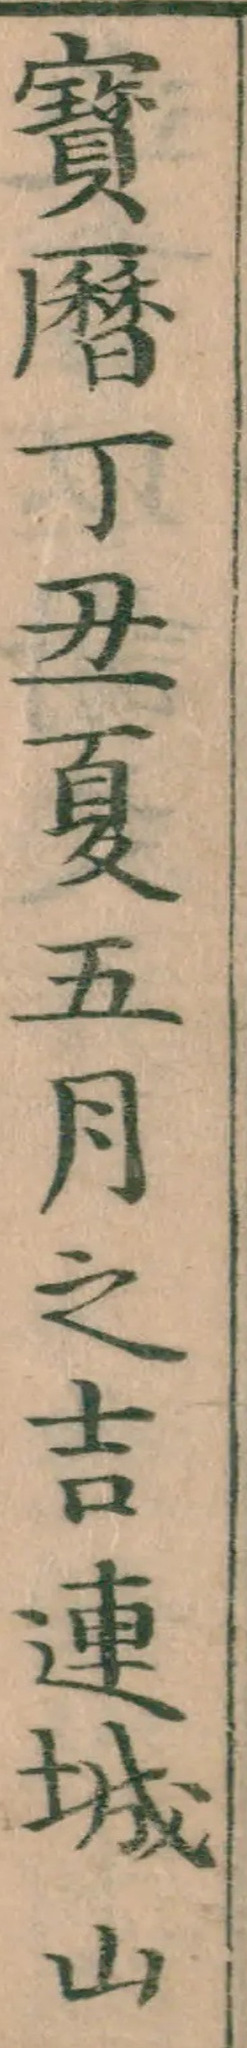宝暦丁丑夏五月之吉連城山
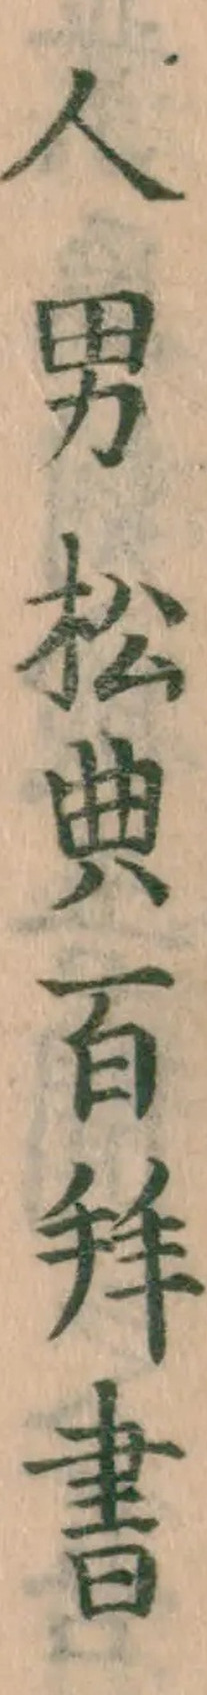人男松典百拝書

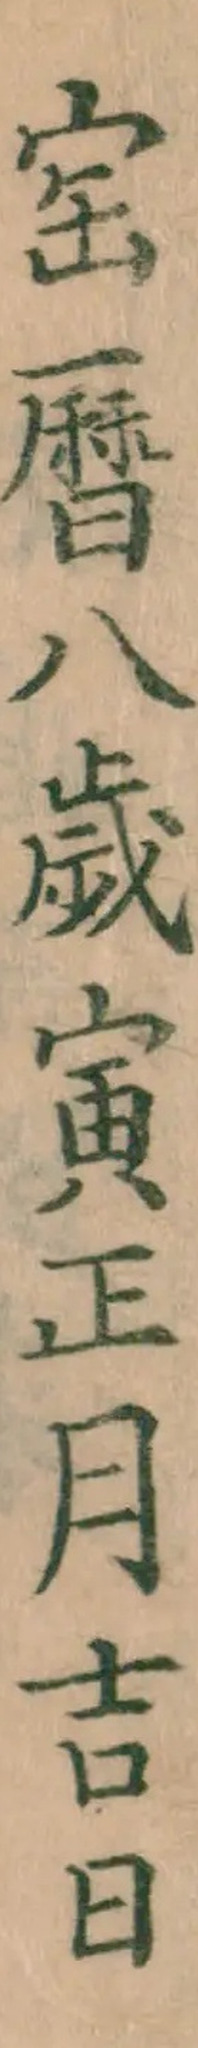宝暦八歳寅正月吉日
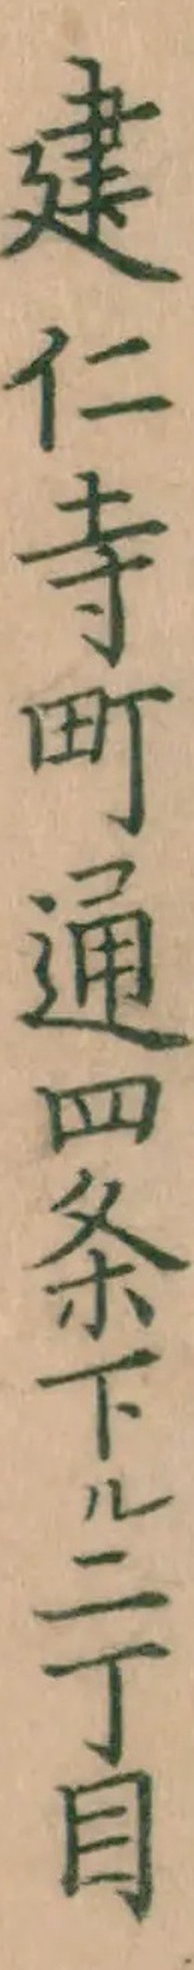建仁寺町通四条下ル二丁目
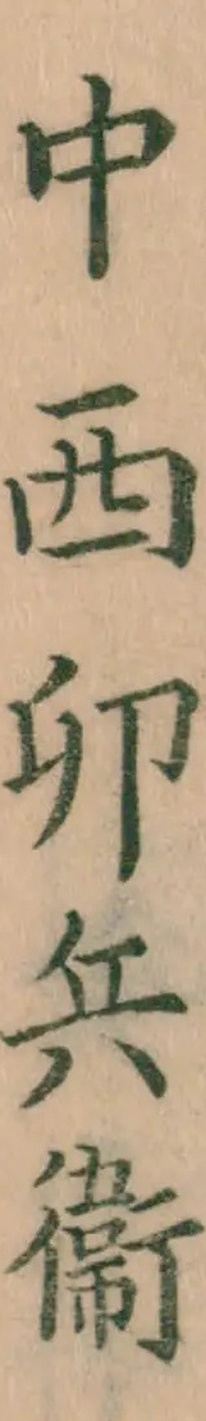中西卯兵衛
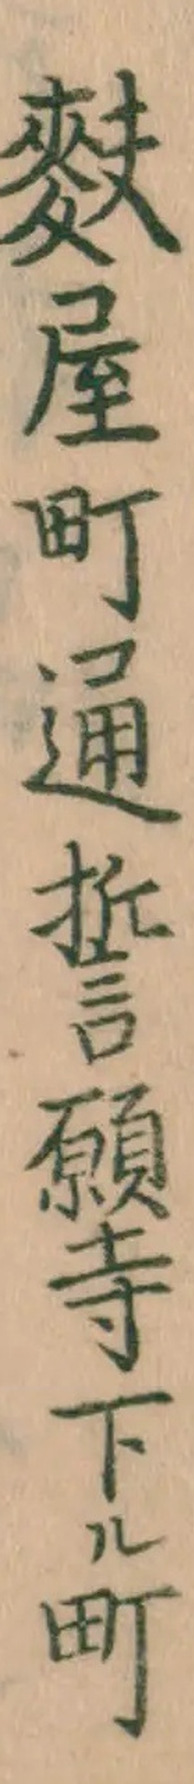麩屋町通誓願寺下ル町
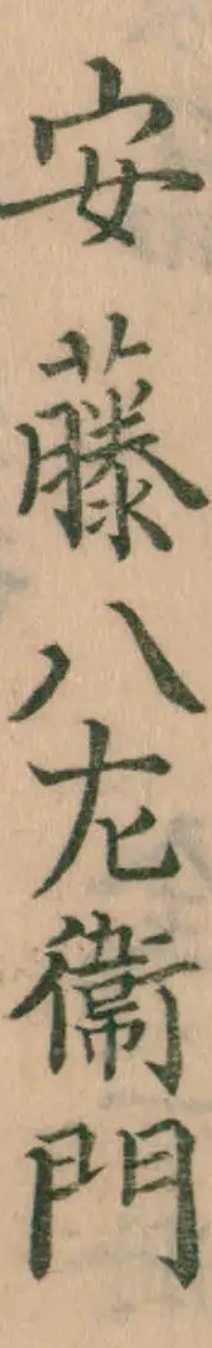安藤八左衛門
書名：怡顔齋櫻品
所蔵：国立国会図書館 National Diet Library, JAPAN
